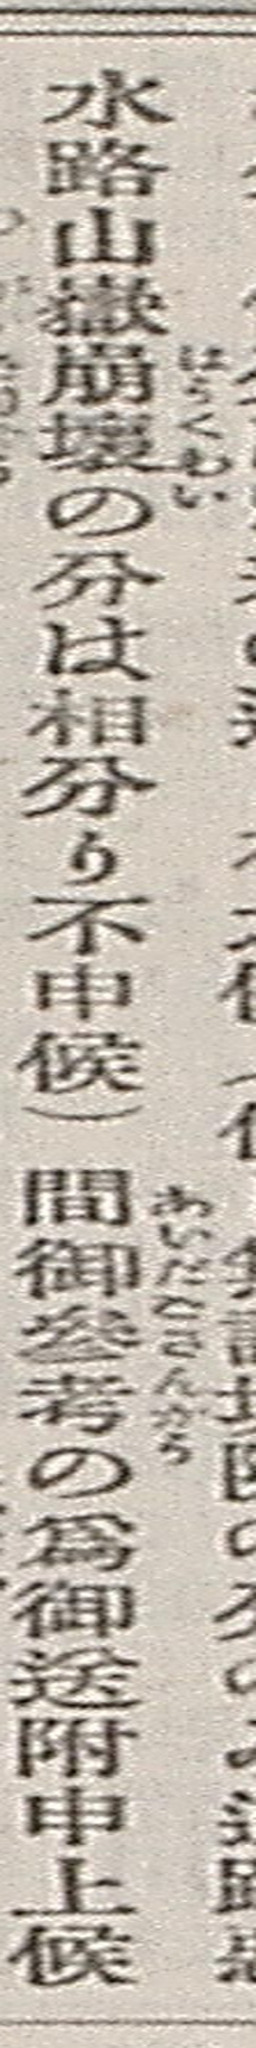水路山嶽崩壊の分は相分り不申候）間御参考の為御送附申上候
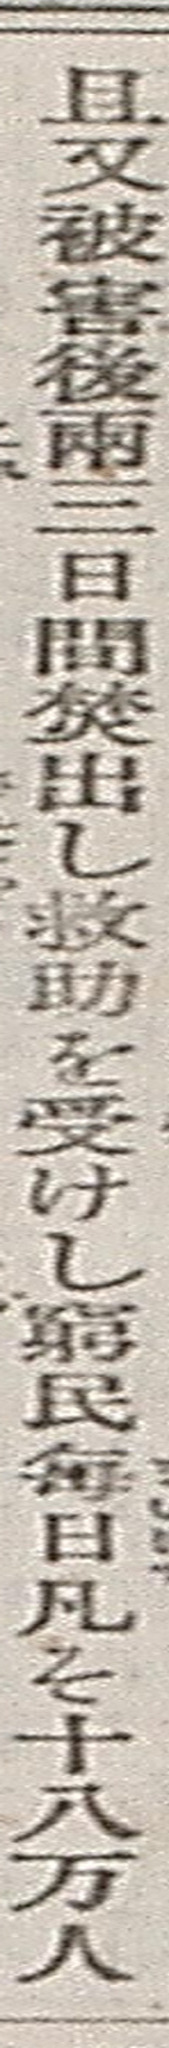且又被害後両三日間焚出し救助を受けし窮民毎日凡そ十八万人
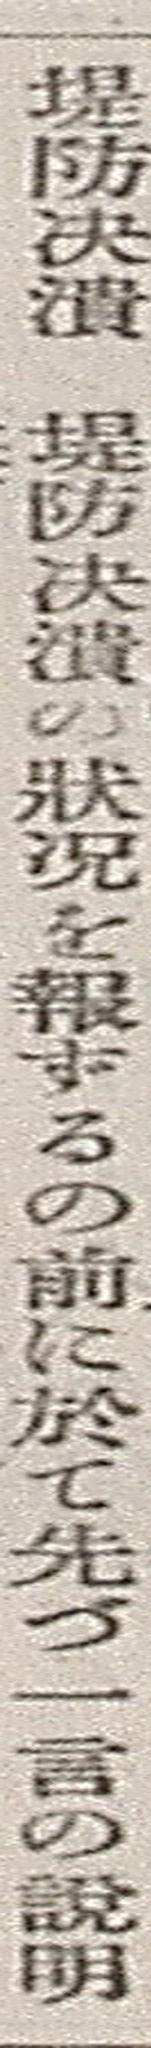堤防決潰堤防决潰の状況を報ずるの前に於て先づ一言の説明
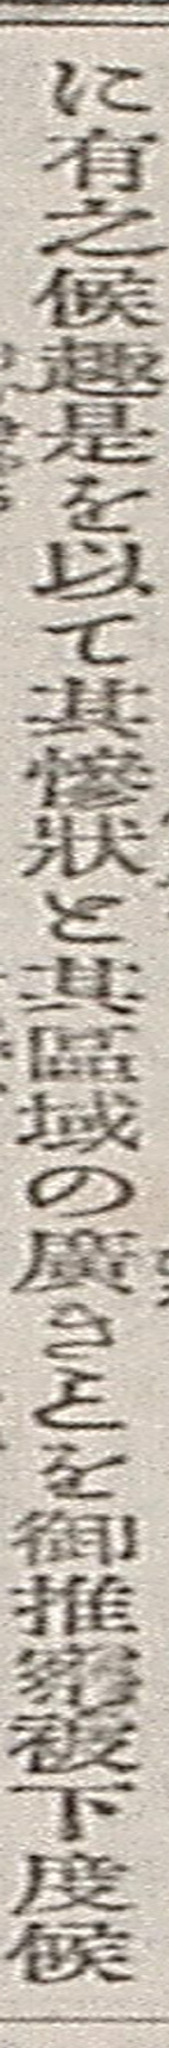に有之候趣是を以て其惨状と其區域の廣きことを御推被下度候
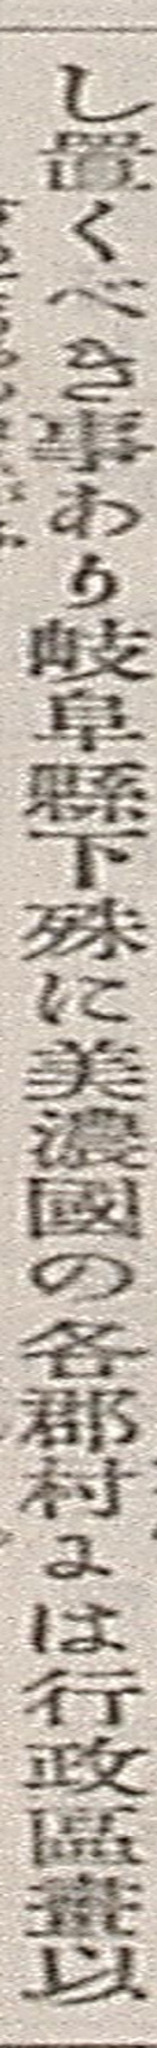し置くべき事あり岐阜県下殊に美濃国の各郡村には行政區畫以
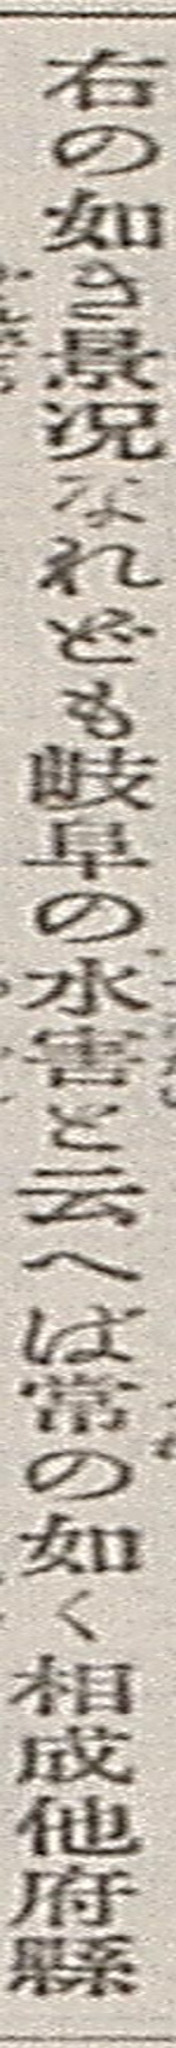右の如き景況なれども岐阜の水害と云へば常の如く相成他府県
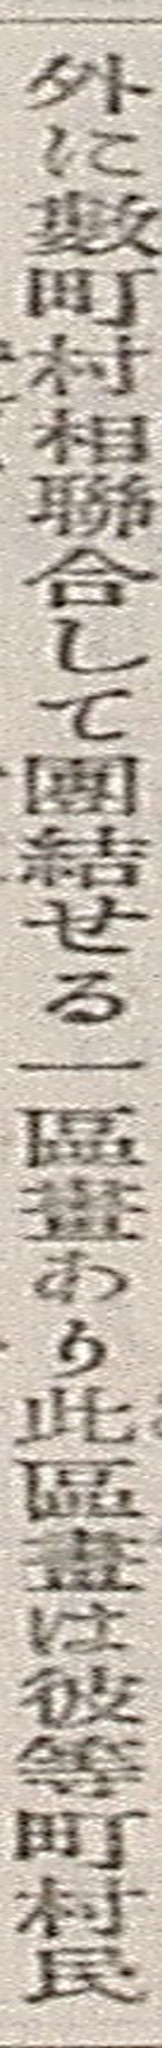外に数町村相聯合して団結せる一區畫あり此區畫は彼等町村民
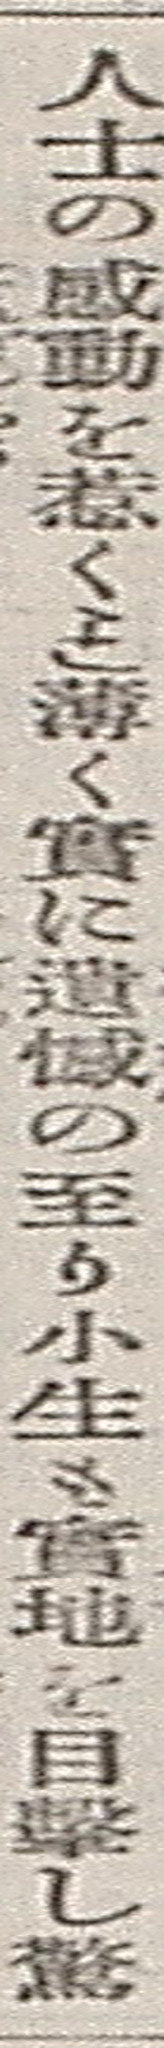人士の感動を惹くこと薄く実に遺憾の至り小生も実地を目撃し驚
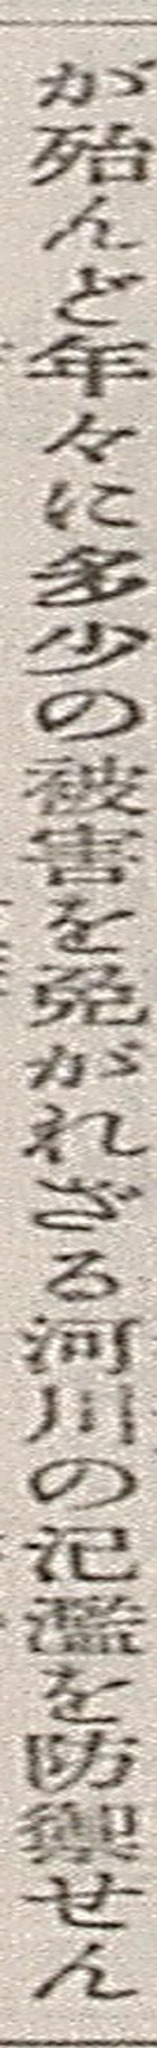が殆んど年々に多少の被害を免がれざる河川の氾濫を防禦せん
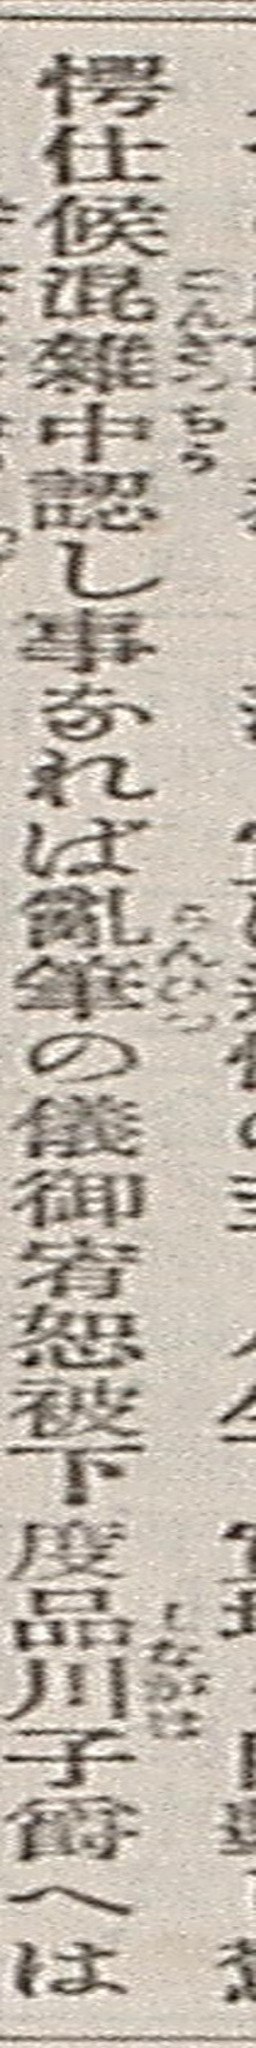愕仕候混雑中認し事なれば乱筆の儀御宥恕被下度品川子爵へは
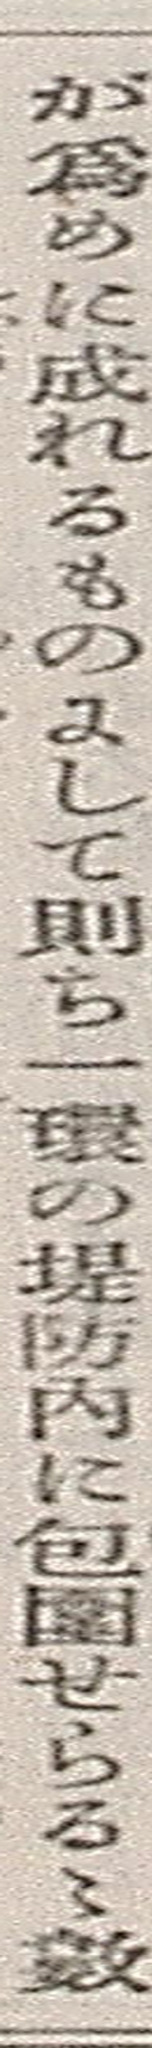が為めに成れるものにして則ち一環の堤防内に包囲せらるゝ数
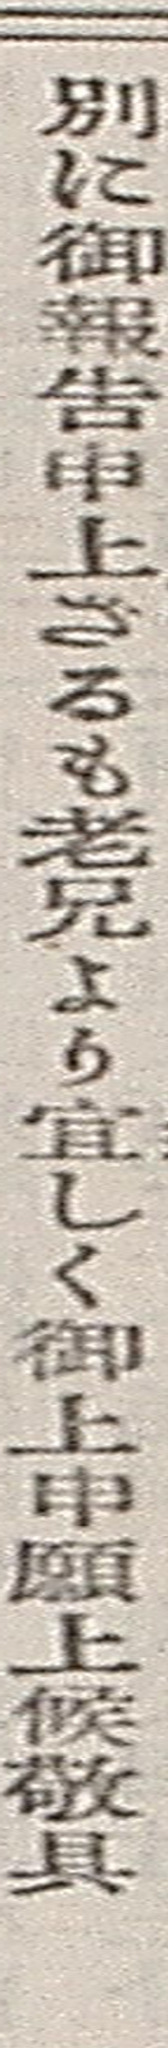別に御報告申上たるも老兄より宜しく御上申願候敬具
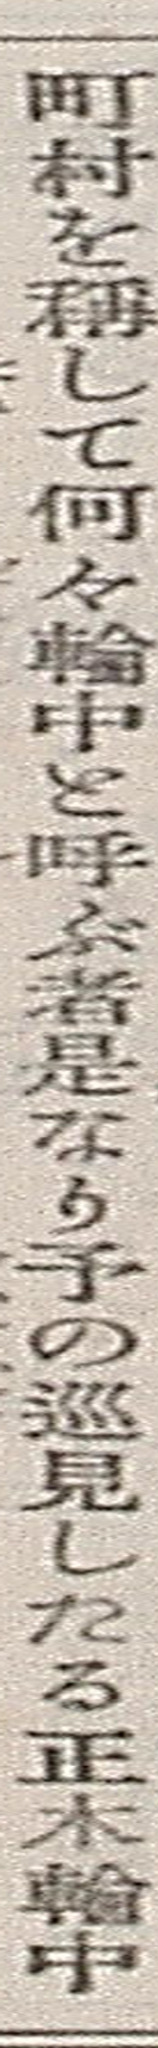町村を称して何々輪中と呼ぶ者是なり予の巡見したる正木輪中
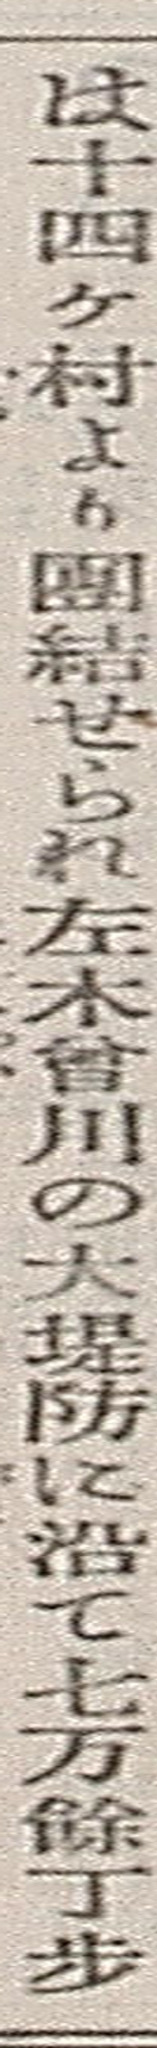は十四ヶ村より団結せられ左木曽川の大堤防に沿て七万餘丁歩
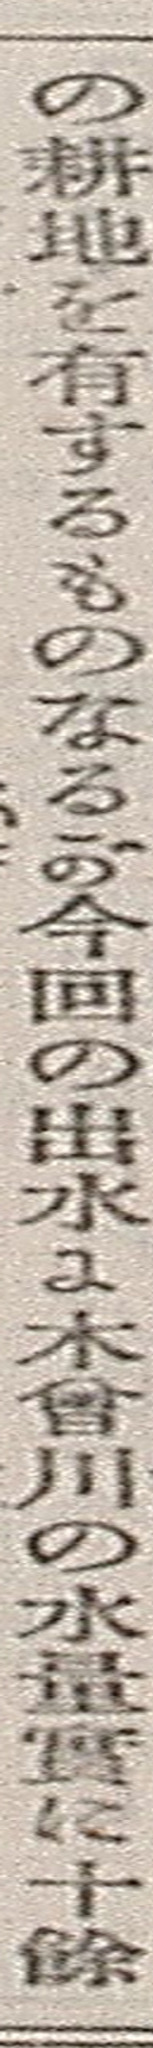の耕地を有するものなるが今回の出水に木曽川の水量実に十餘
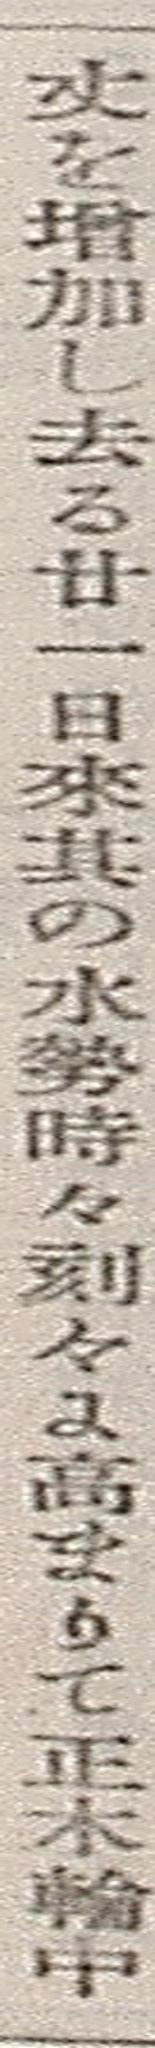丈を増加し去る廿一日來其の水勢時々刻々に高まりて正木輪中
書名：風俗畫報臨時増刊第百二十六號　洪水被害録（中）
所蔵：東京大学地震研究所図書室 Earthquake Research Institute Library, The University of Tokyo, JAPAN
